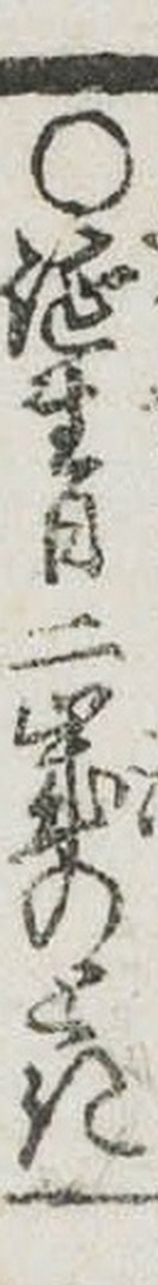○誕生日二歳のとき
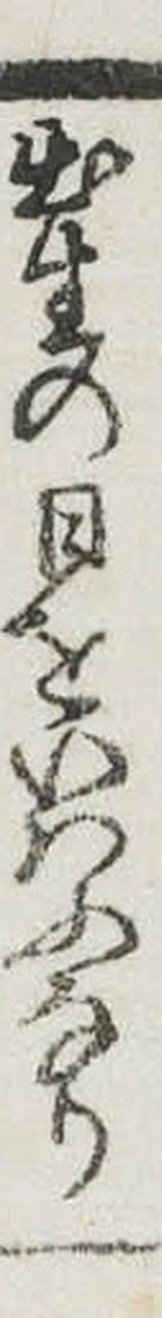出生の日をいはふなり
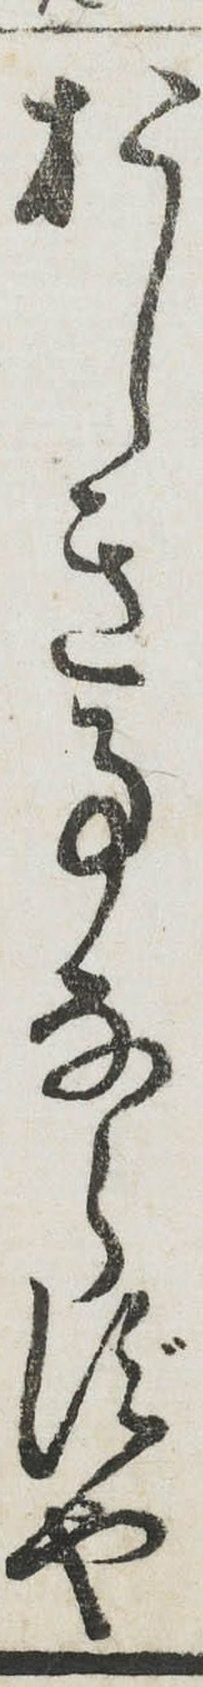おしき事ならずや
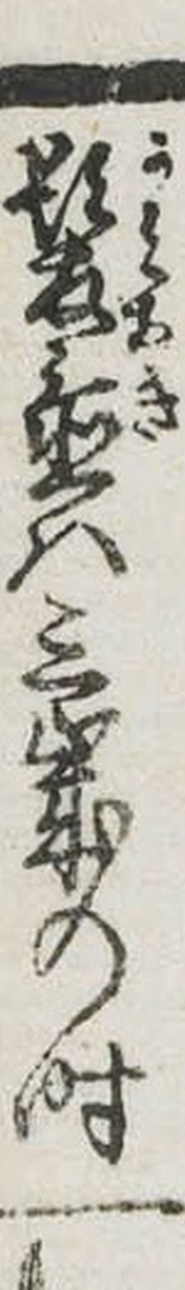髪置は三歳の時
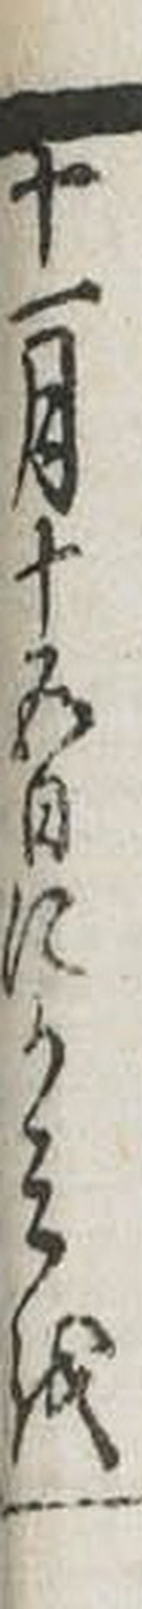十一月十五日にかみを
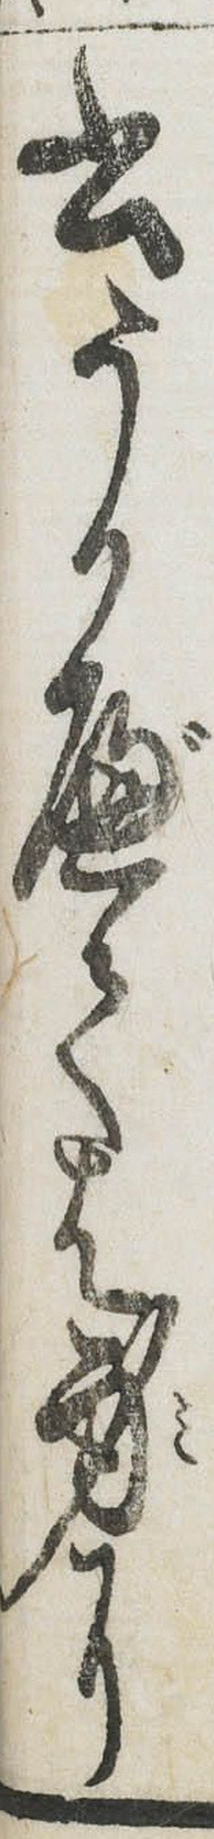書うかべては身に
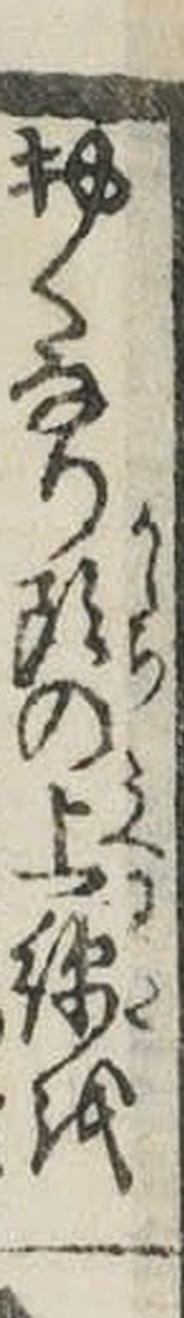おくなり頭の上綿を
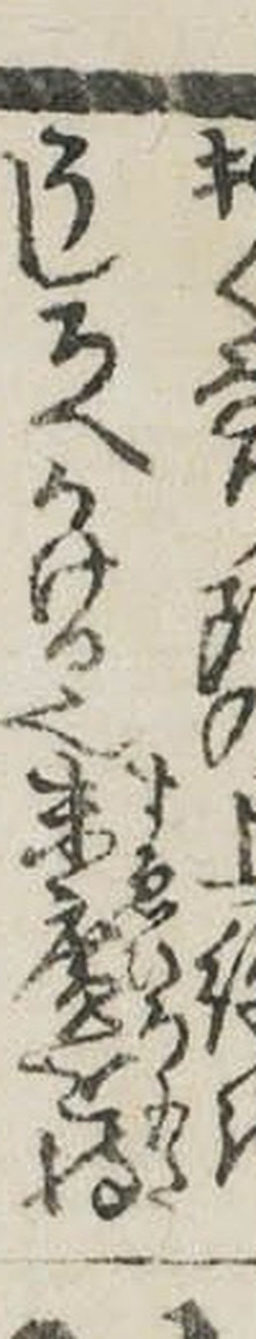うしろへかける也末広を持
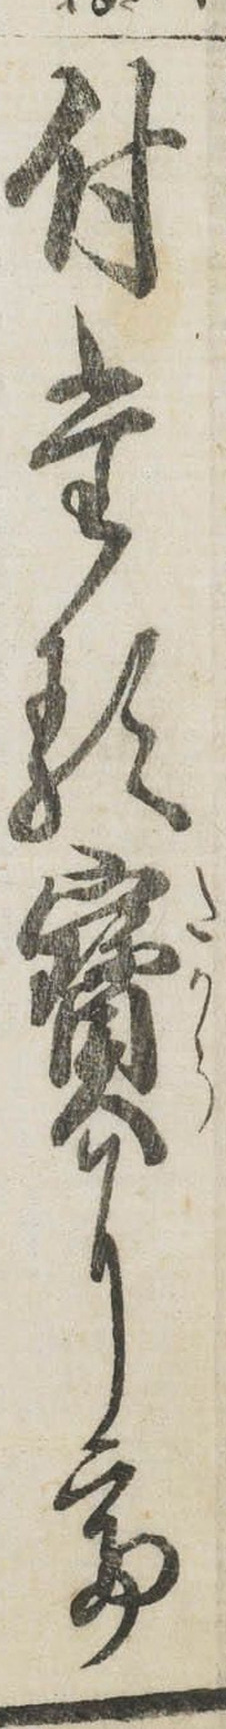付たる宝にて
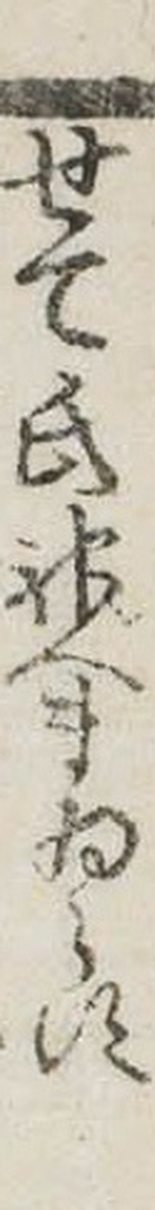せて氏神へまゐらす
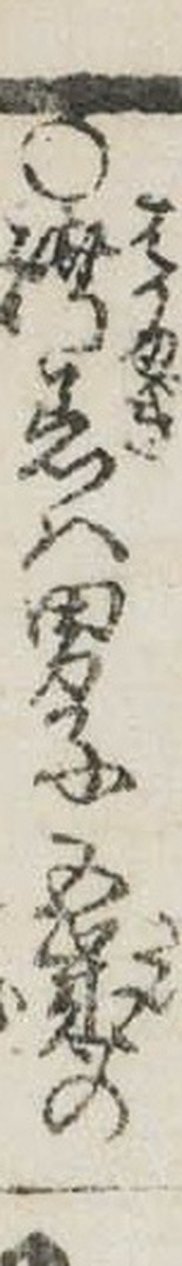○袴着は男子五歳の
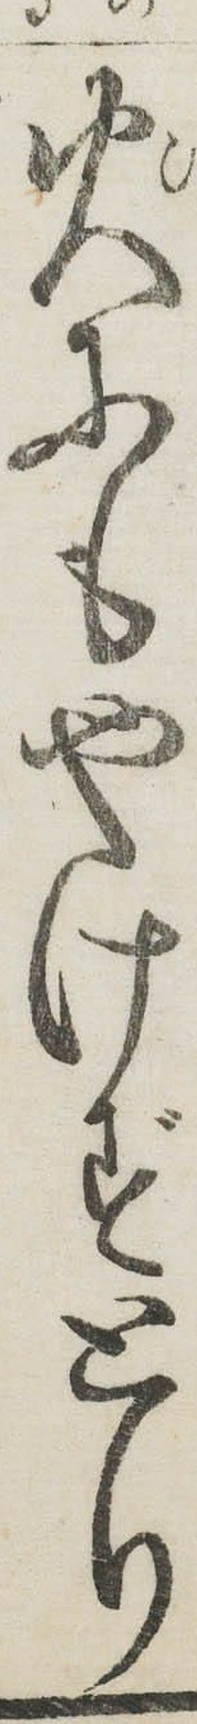火にもやけずとり
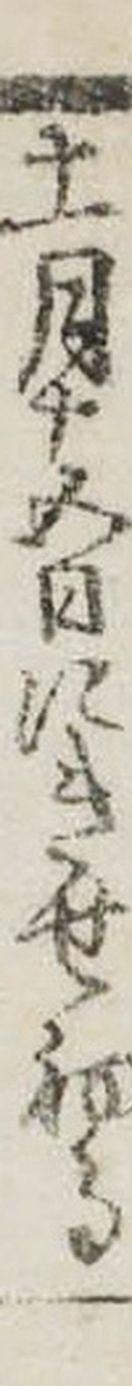十一月十五日にきせ初る
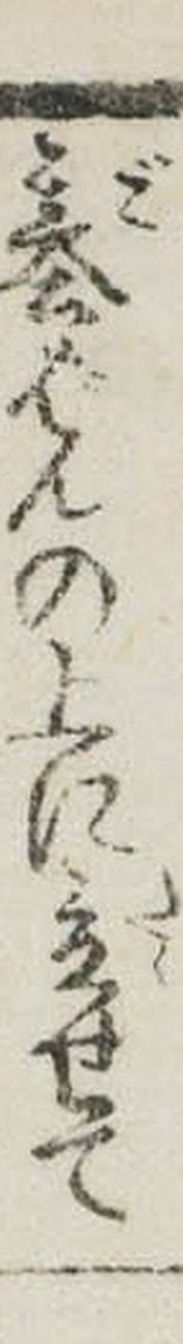碁ばんの上に立せて
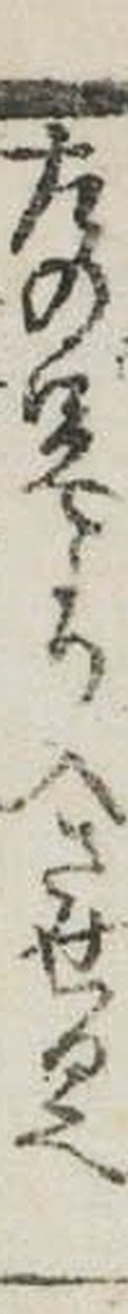左の足より入させる也
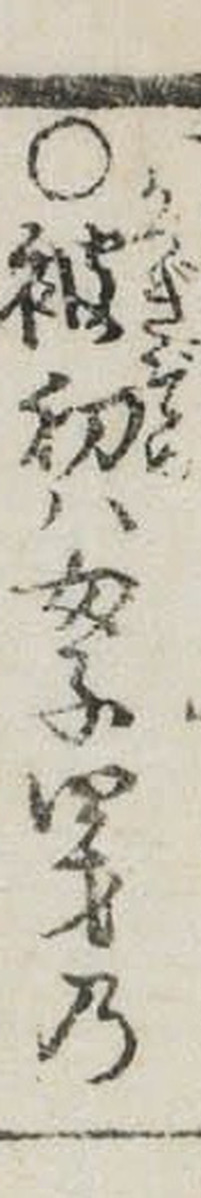○被初は女子四才の
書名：頭書萬用婦人手紙之文言
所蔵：東京学芸大学教育コンテンツアーカイブ
